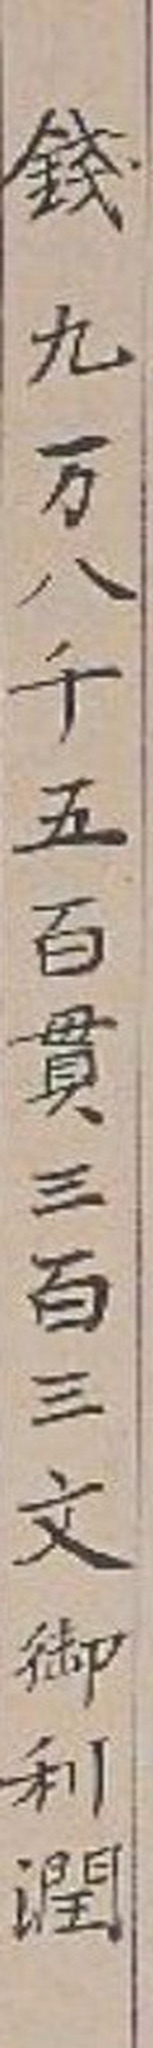錢九万八千五百貫三百三文御利潤
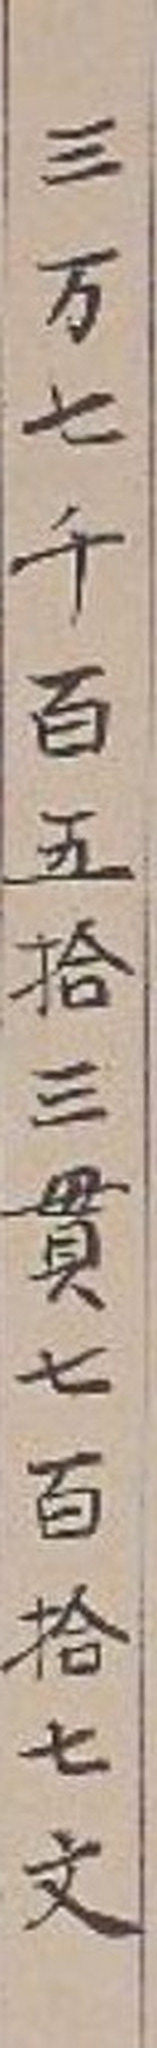三万七千百五拾三貫七百拾七文
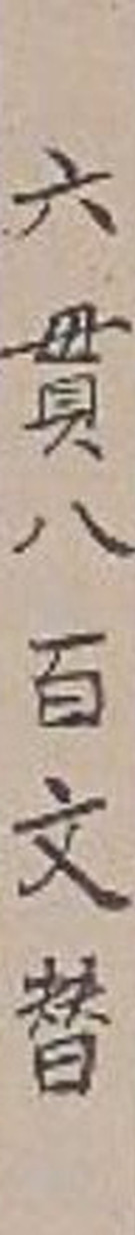六貫八百文替
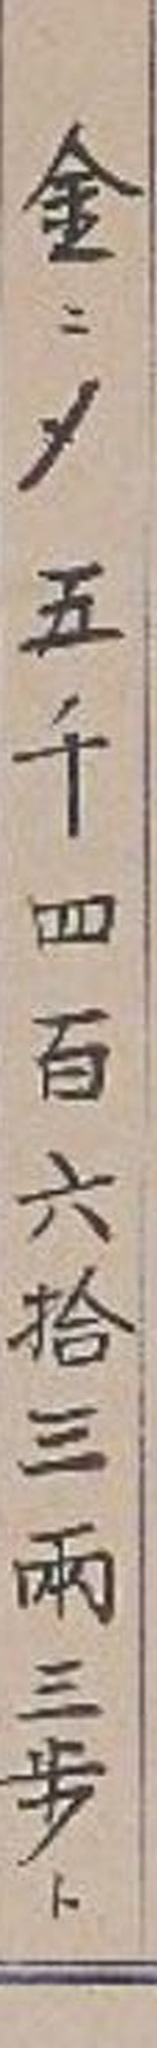金ニシテ五千四百六拾三兩三歩ト
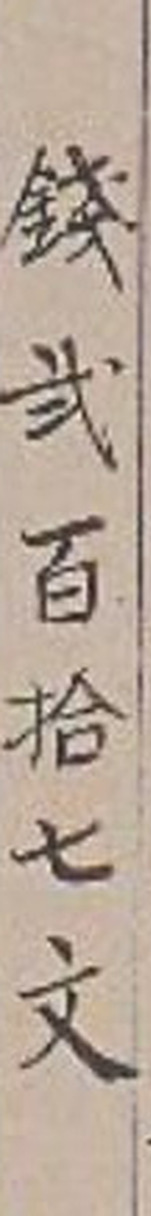錢弐百拾七文
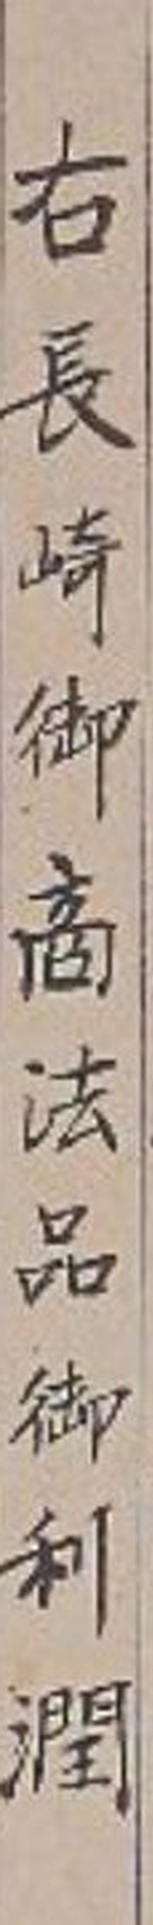右長崎御商法品御利潤

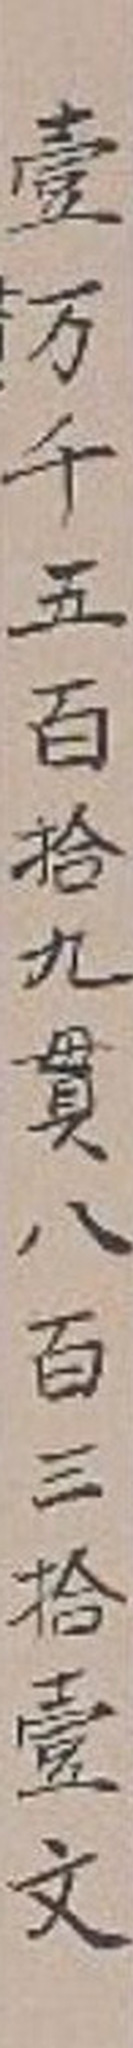壹万千五百拾九貫八百三拾壹文
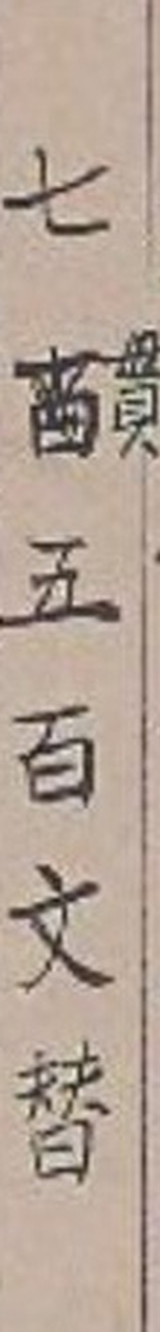七貫五百文替
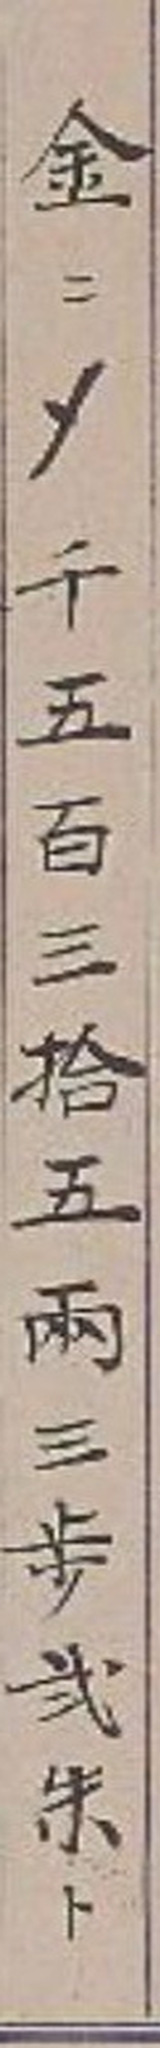金ニシテ千五百三拾五兩三歩弐朱ト
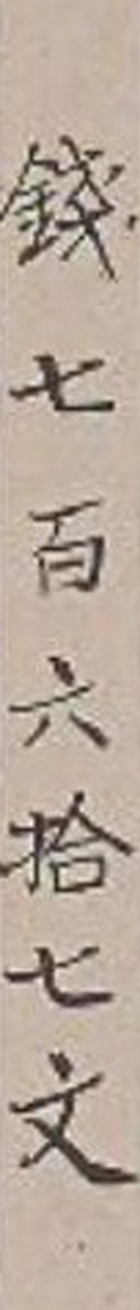錢七百六拾七文
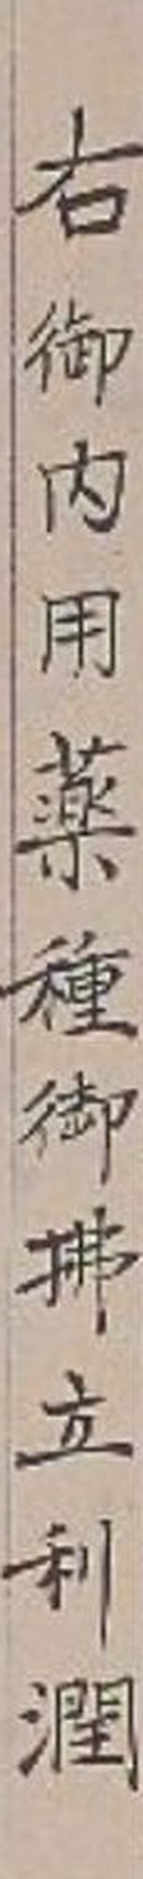右御内用薬種御拂立利潤
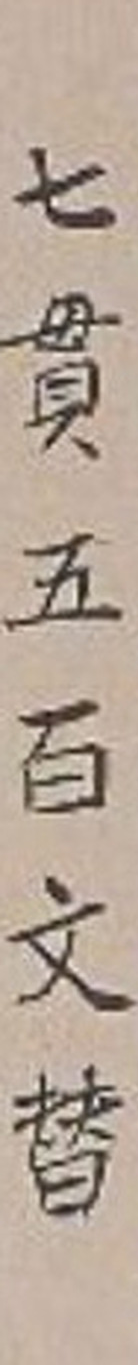七貫五百文替
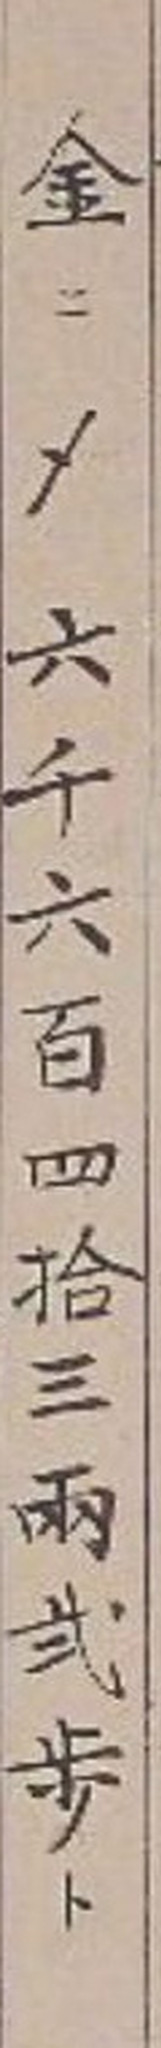金ニシテ六千六百四拾三兩弐歩ト
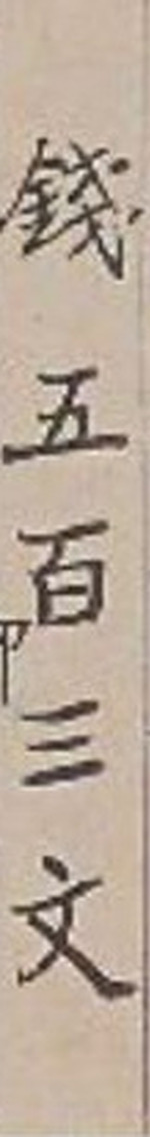錢五百三文
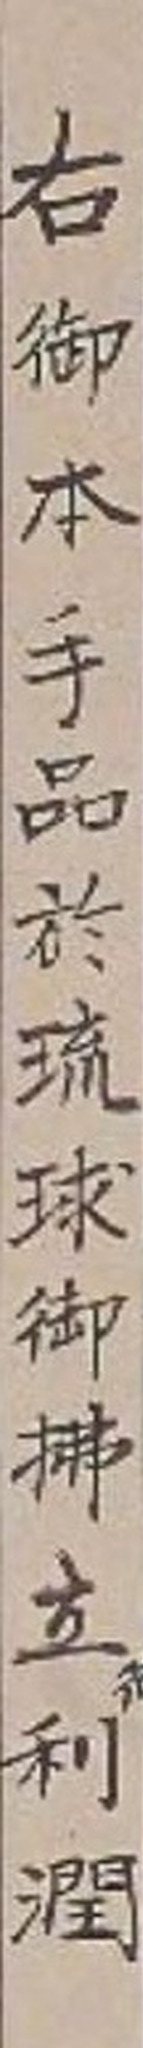右御本手品於琉球御拂立御利潤
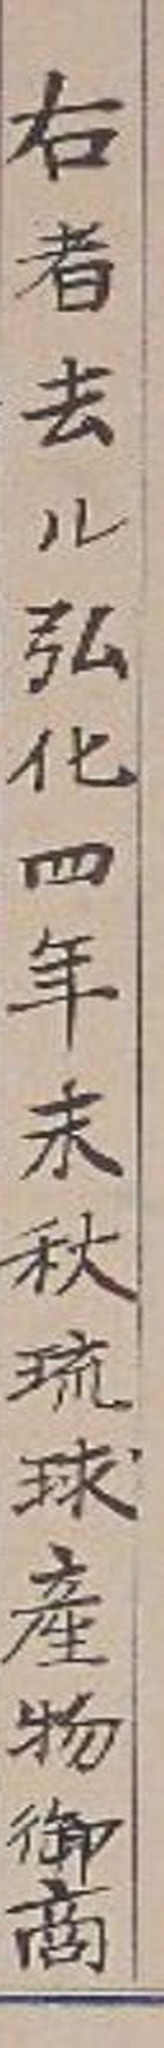右者去ル弘化四年末秋琉球産物御商
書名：琉球産物於長崎拂立並本手品利潤総帖 弘化四年より酉年迄
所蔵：University of the Ryukyus Library
